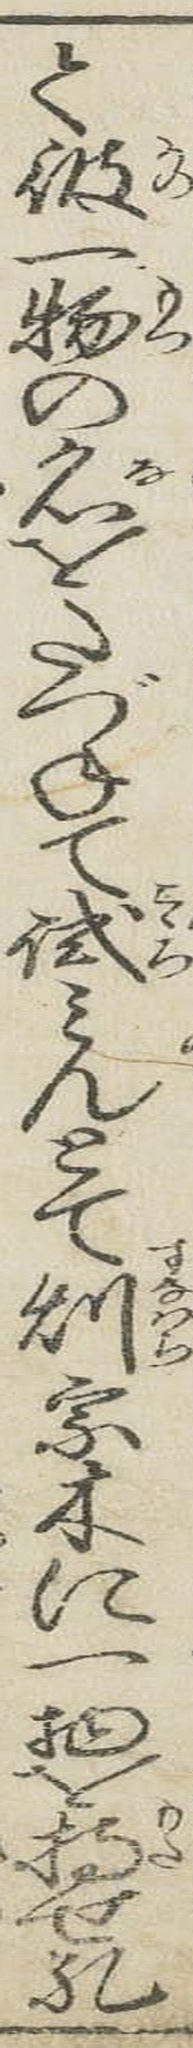て彼一物の名をたづねて試みんとて則宗木に一物を持せ孔
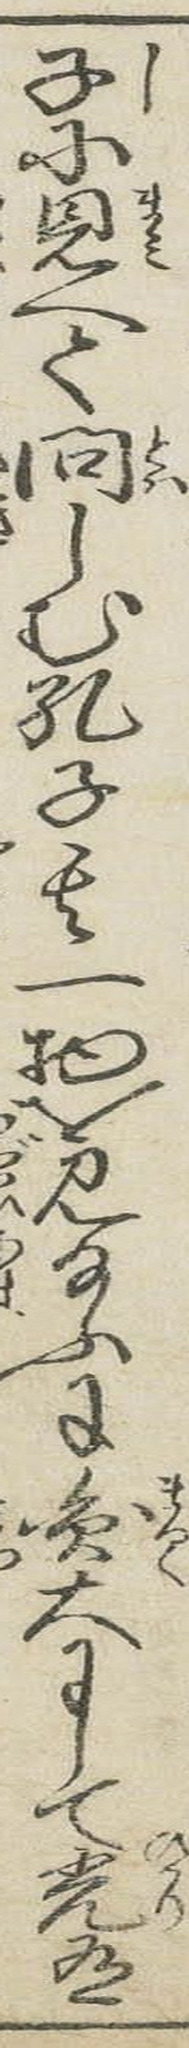子に見へて問しむ孔子其一物を見給ふに円大にして光有
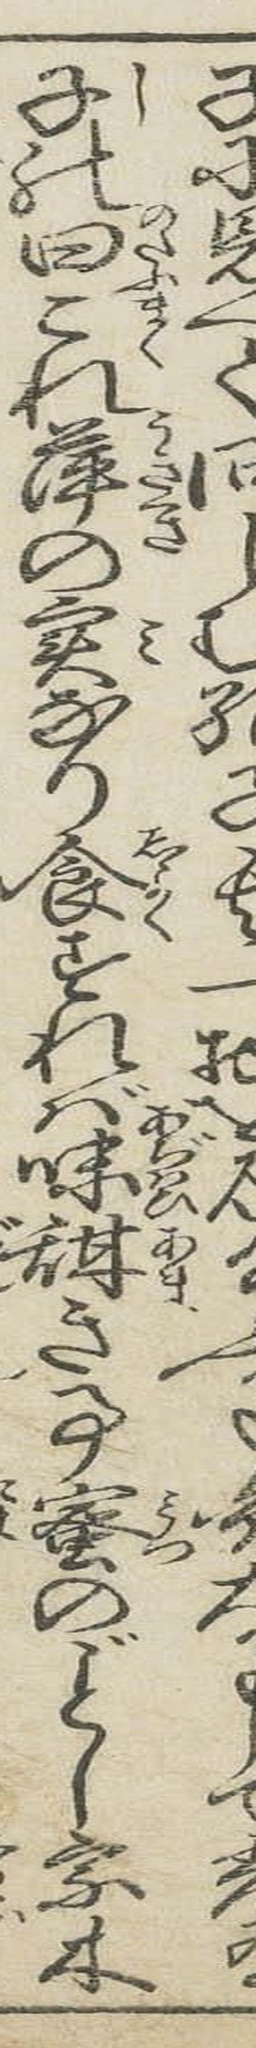子の曰これ萍の実なり食すれば味甜き事蜜のごとし宗木
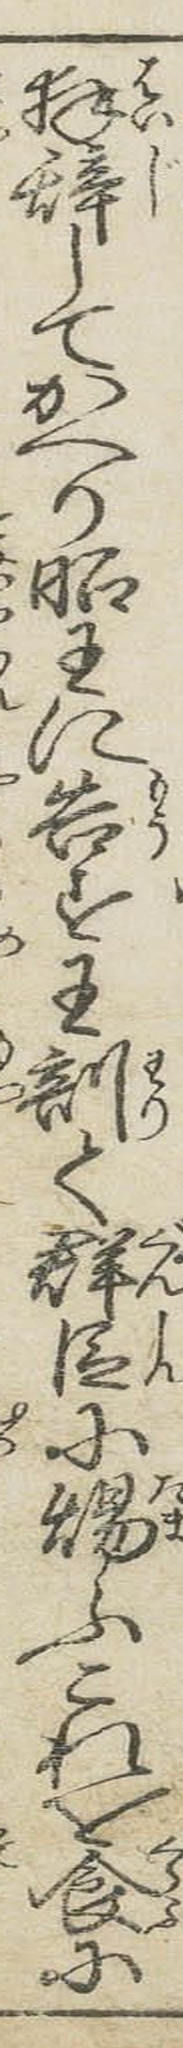拝辞してかへり昭王に告す王割て群臣に賜ふこれを食に
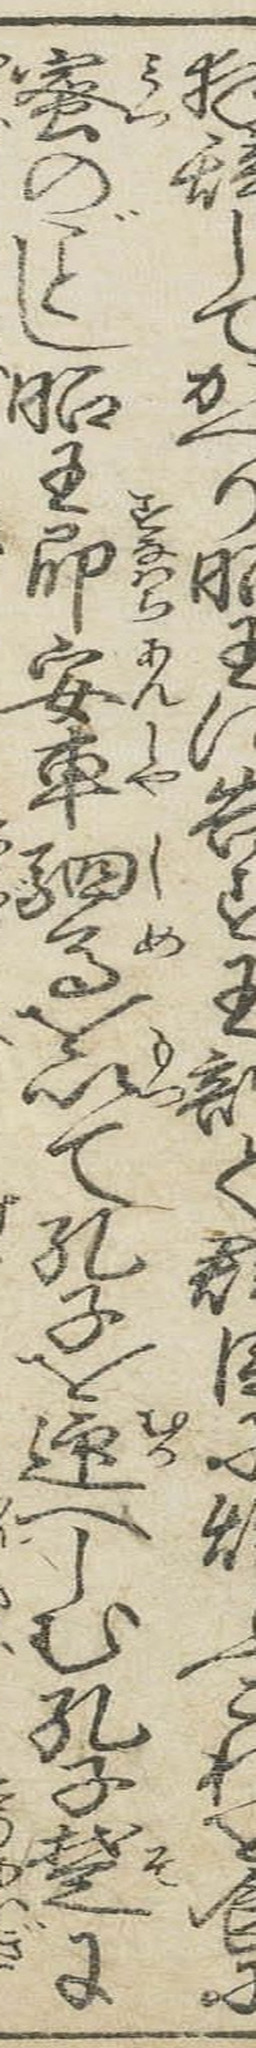蜜のごとし昭王即安車駟馬を以て孔子を迎へしむ孔子楚に
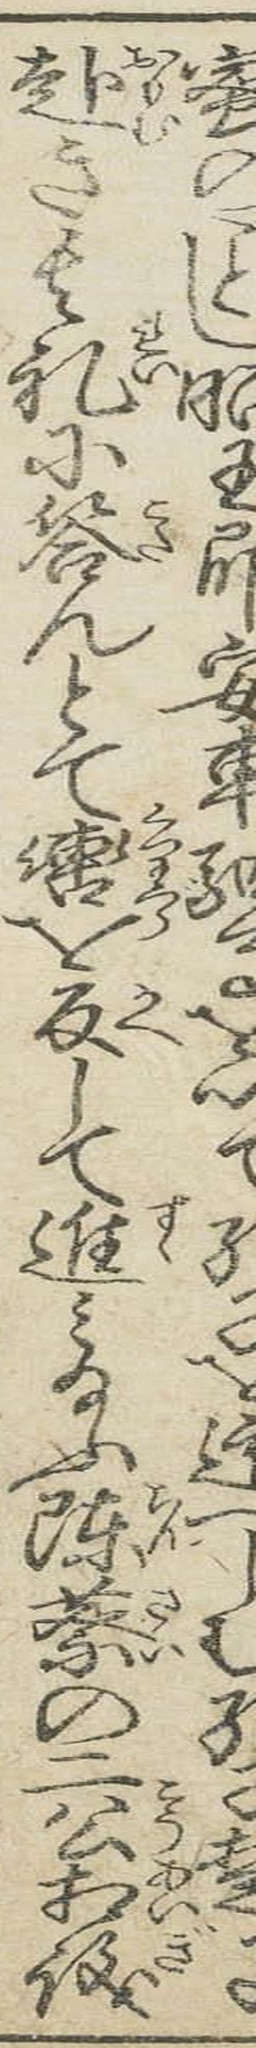赴き其礼に答んとて轡を反して進み給ふ陳蔡の二公相議
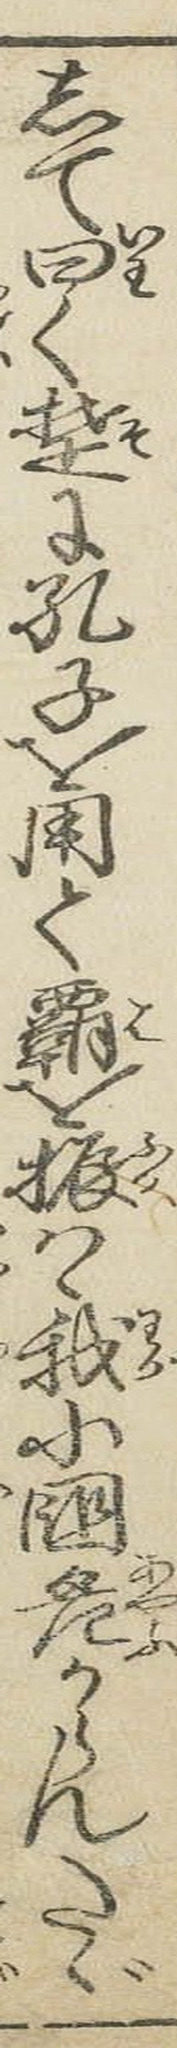して曰く楚に孔子を用て覇を振はゝ我小国危からんたゞ
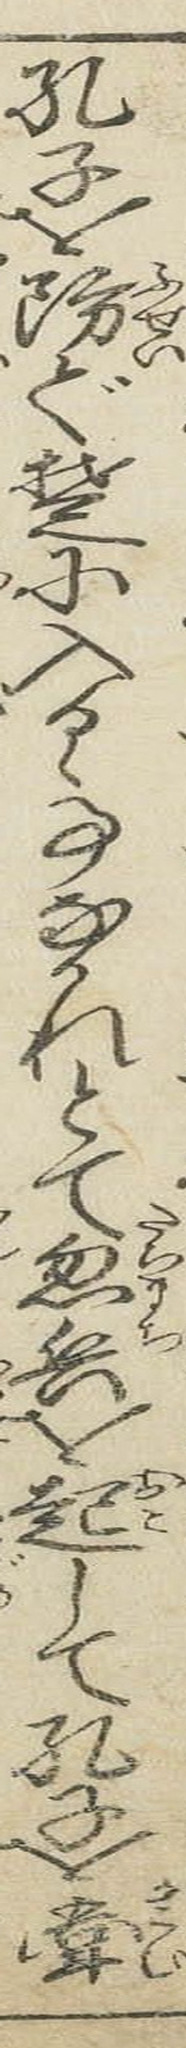孔子を防で楚に入るゝ事なかれとて忽兵を起して孔子を囲
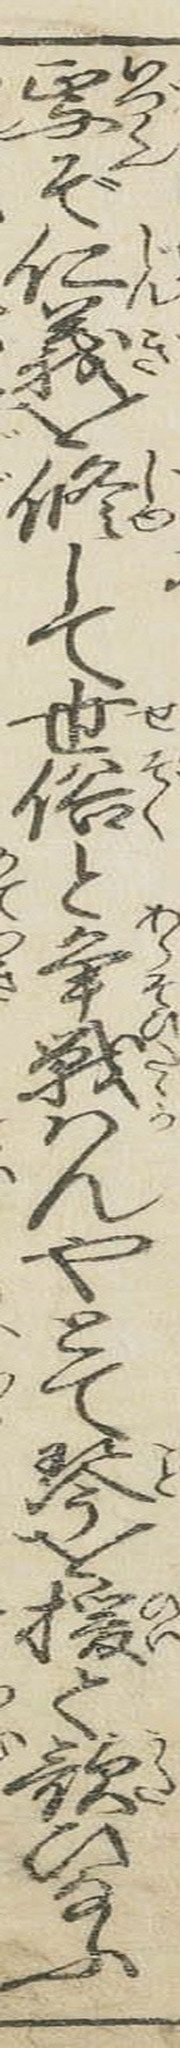焉ぞ仁義を修して世俗と争戦はんやとて琴を援て歌ひ給ふ
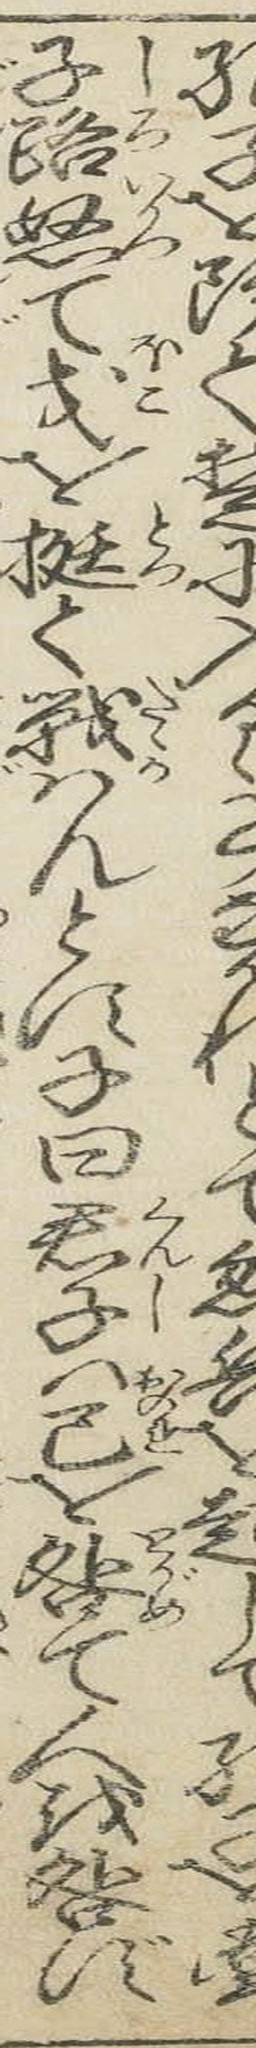子路怒て戈を挺て戦はんとす子曰君子は己を咎て人を咎ず
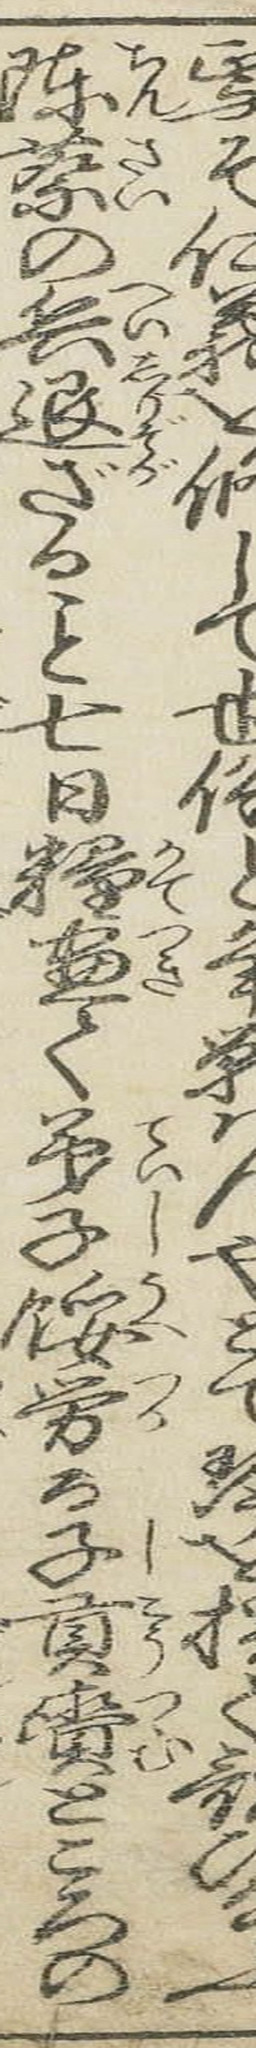陳蔡の兵退ざること七日糧尽て弟子餒労る子貢齎ところの
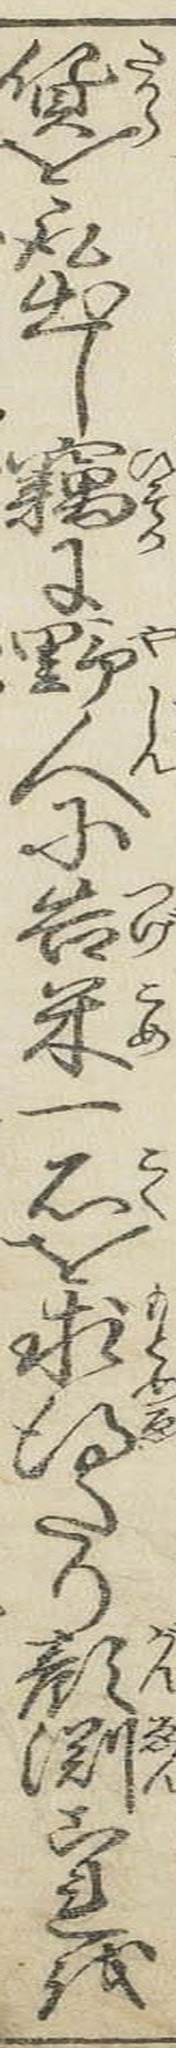貨を取出し窃に野人に告米一石を求得たり顔淵これを
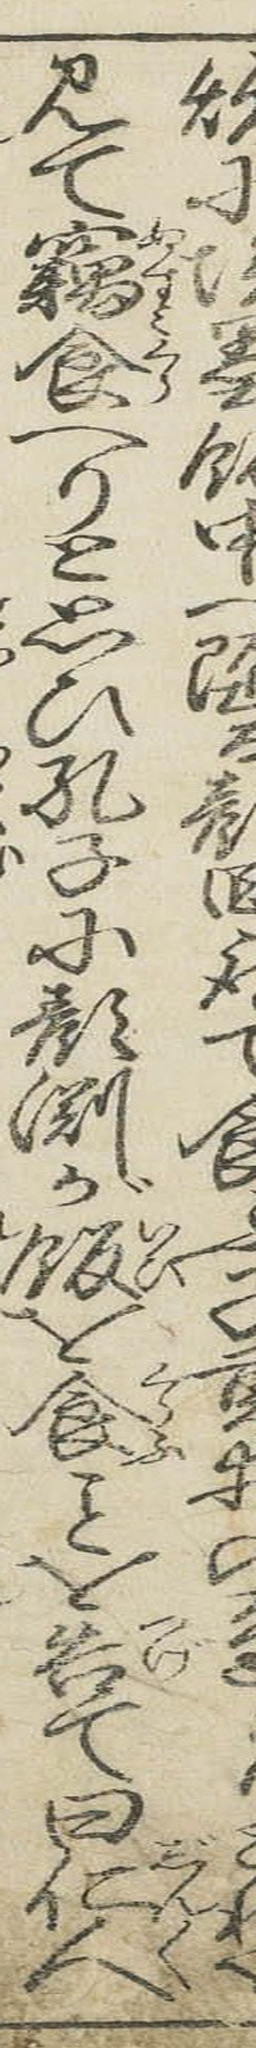見て窃食へりと思ひ孔子に顔淵が飯を食ことを告て曰仁人
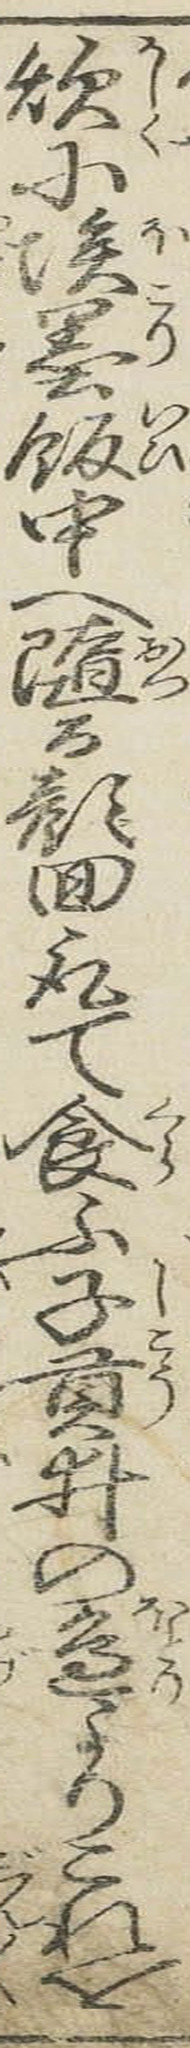炊に埃墨飯中へ堕る顔回取て食ふ子貢井の辺よりこれを
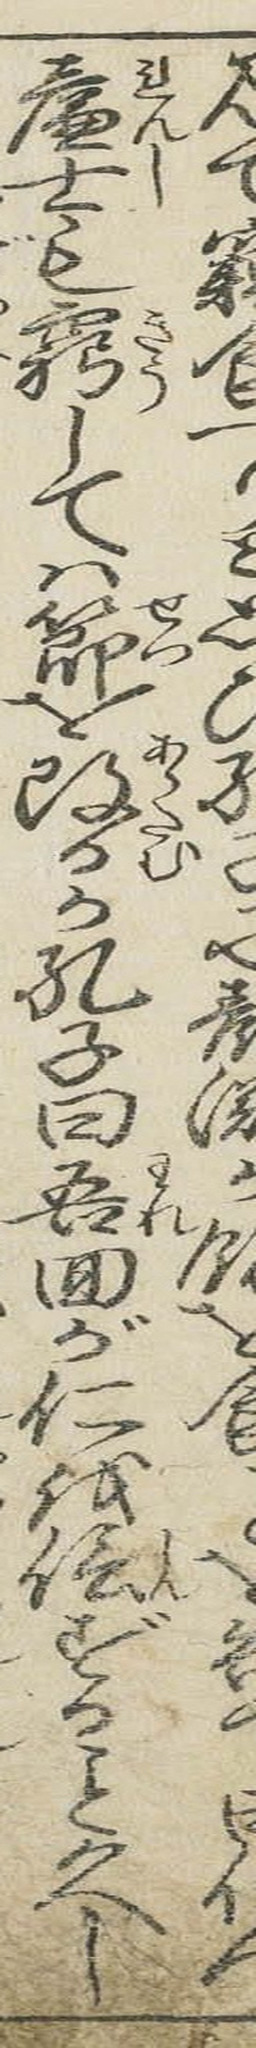廉士も窮しては節を改るか孔子曰吾回が仁を信ずること久し
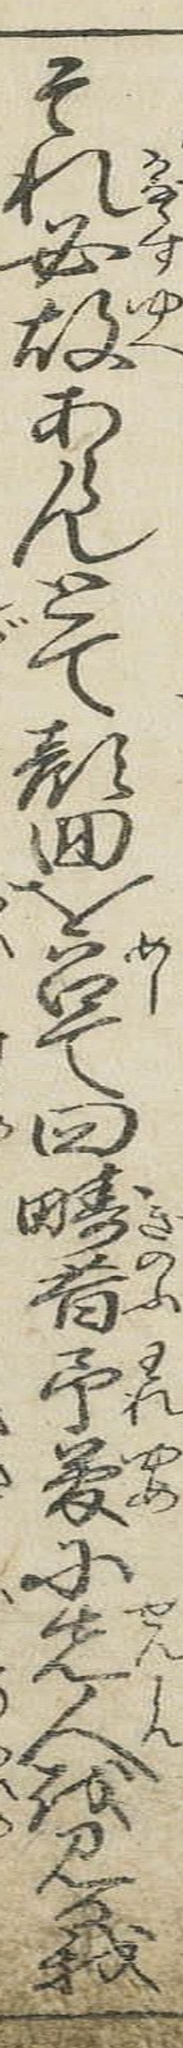それ必故あらんとて顔回を召て曰疇昔予夢に先人を見る我
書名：絵本写宝袋 9巻 6之巻
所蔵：東京学芸大学教育コンテンツアーカイブ
